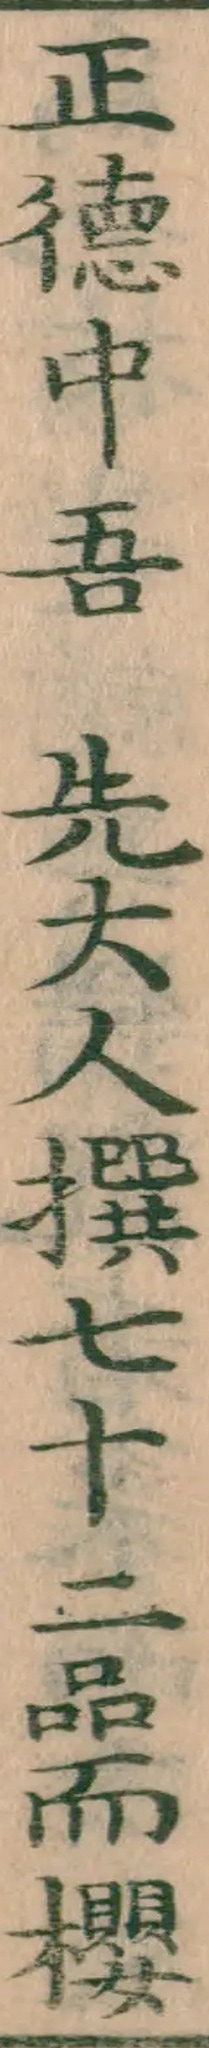正徳中吾先大人撰七十二品而桜
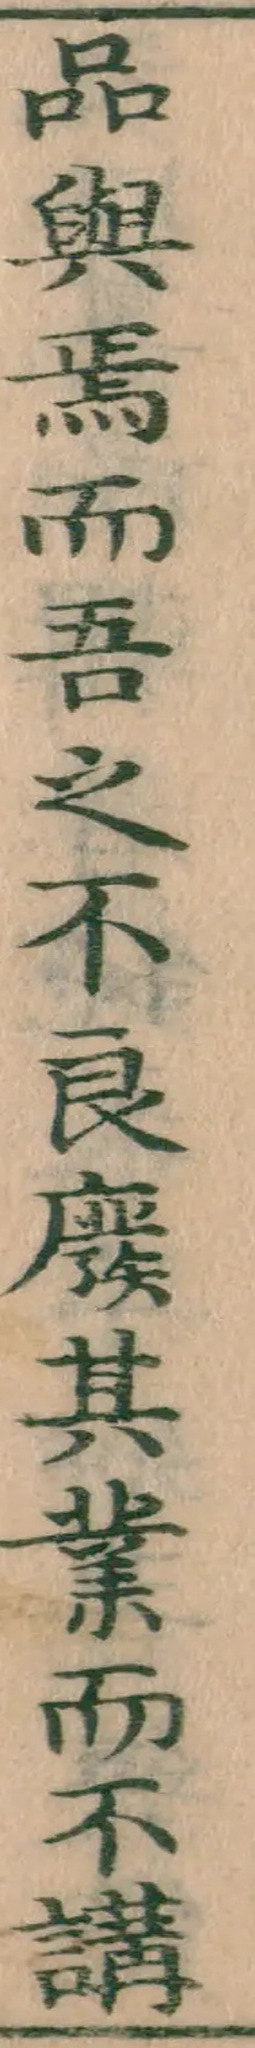品與焉而吾之不良廃其業而不講
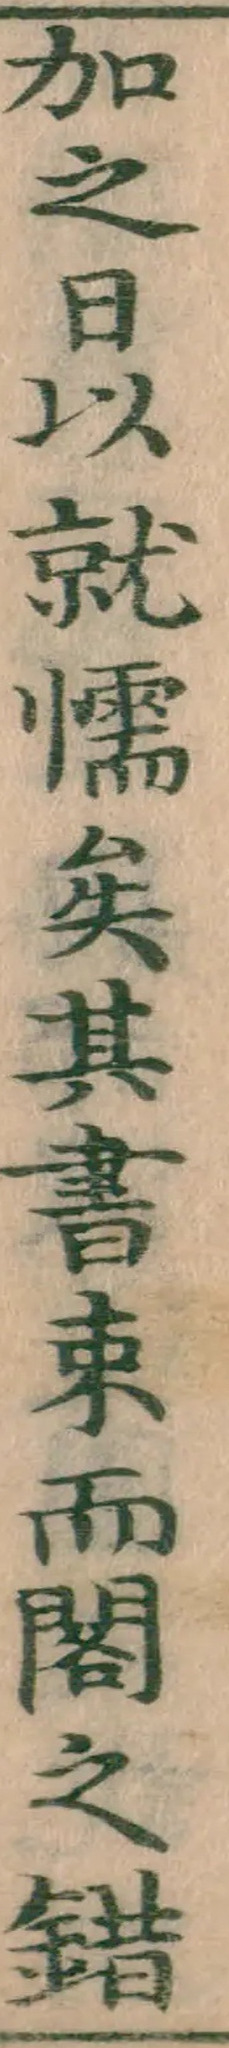加之日以就懦矣其書束而閣之錯
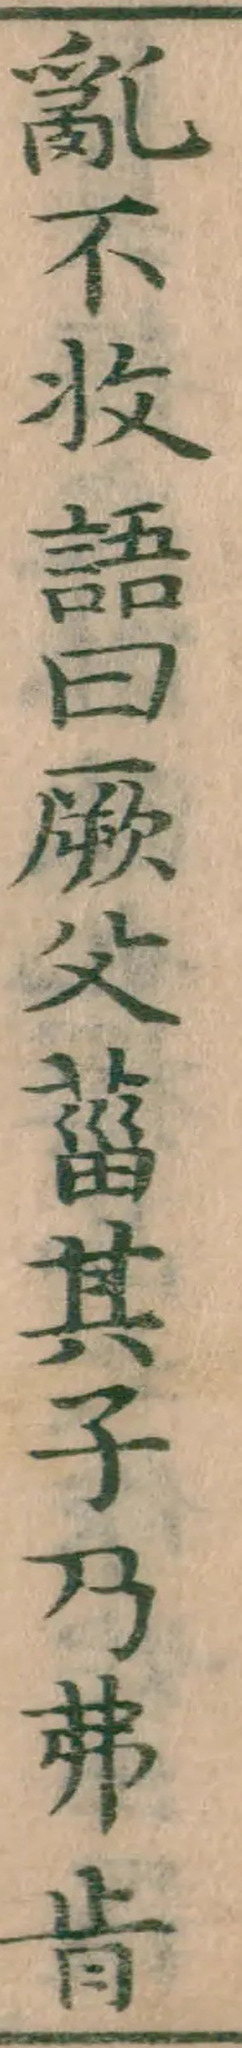乱不収語曰厥父菑其子乃弗肯
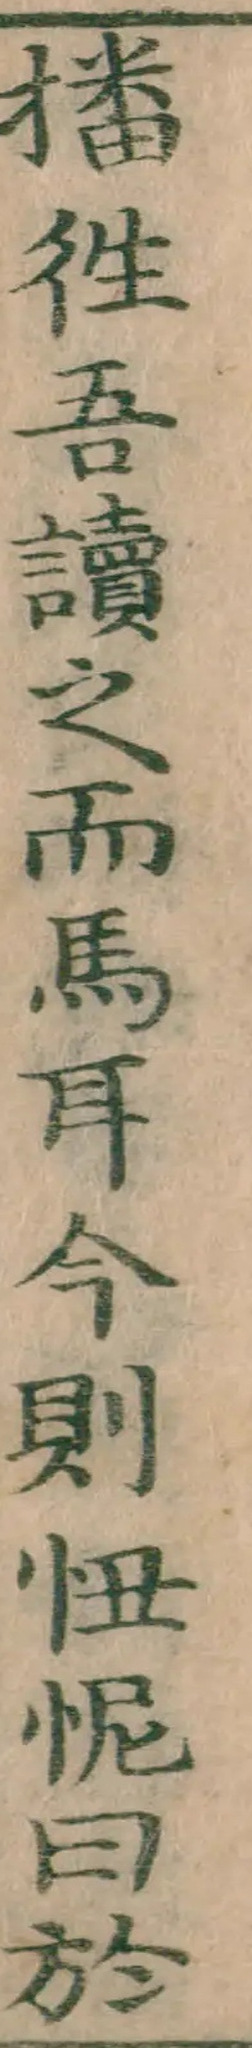播徃吾読之而馬耳今則忸怩曰於

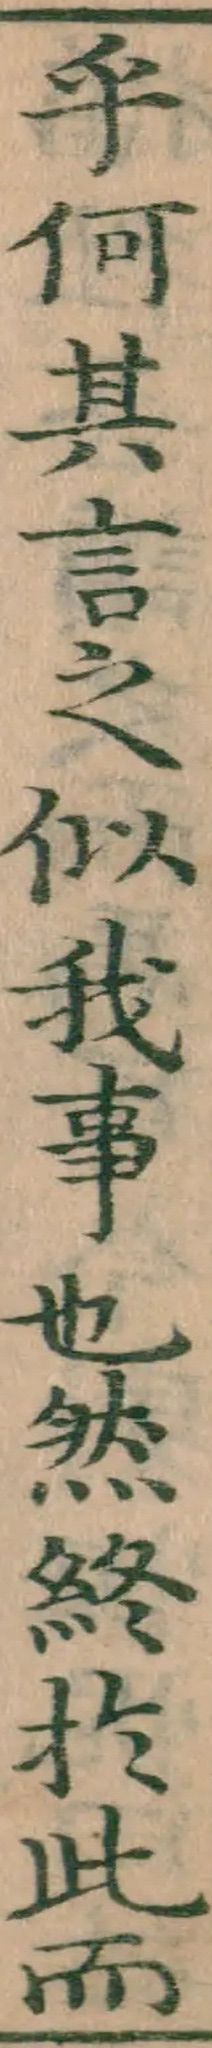乎何其言之似我事也然終於此而
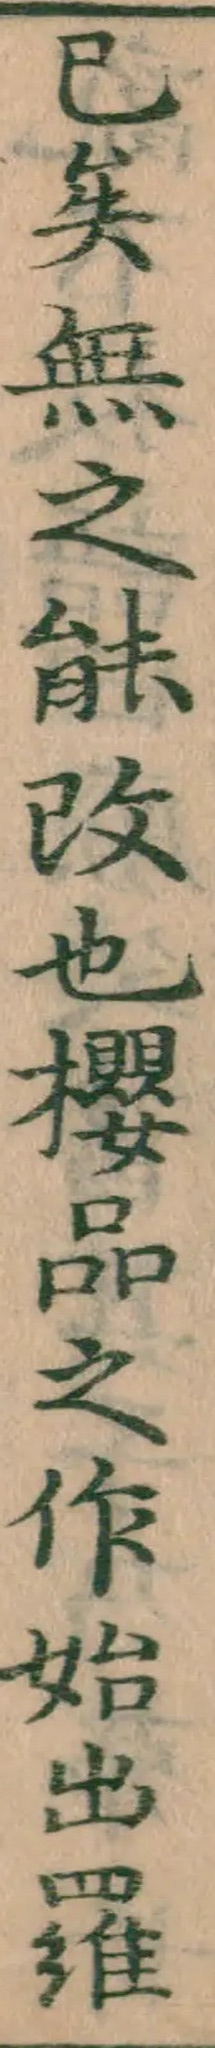已矣無之能改也桜品之作始出羅
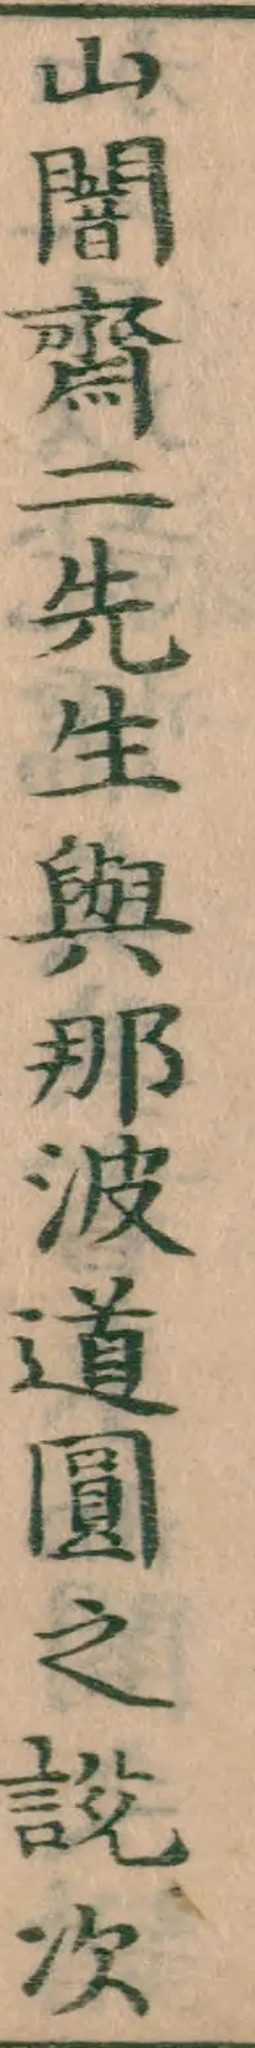山闇斎二先生与那波道円之説次
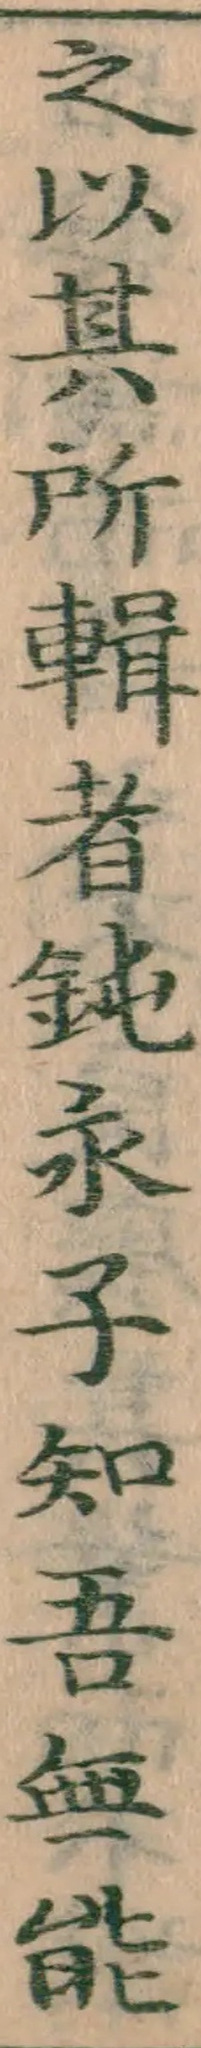之以其所輯者鈍永子知吾無能
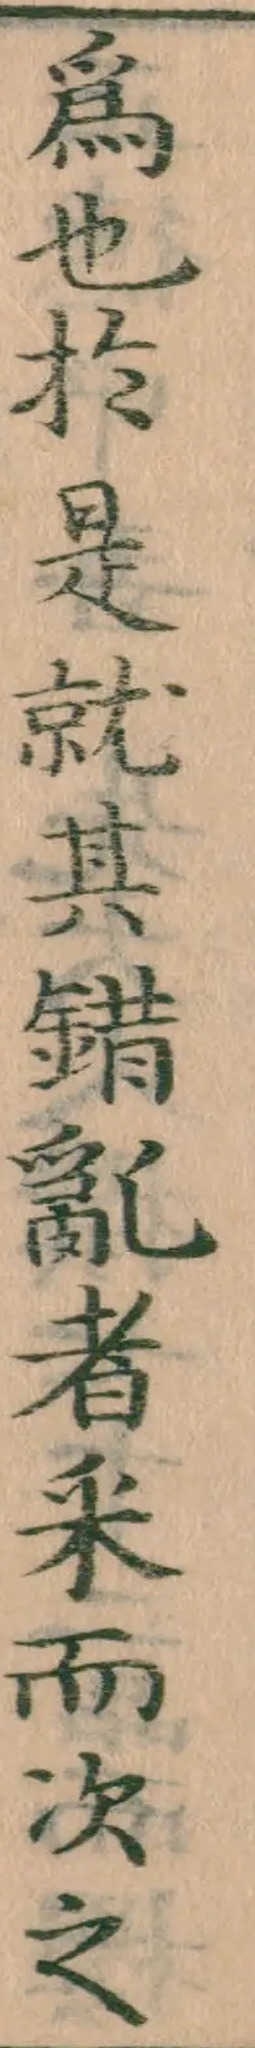為也於是就其錯乱者采而次之
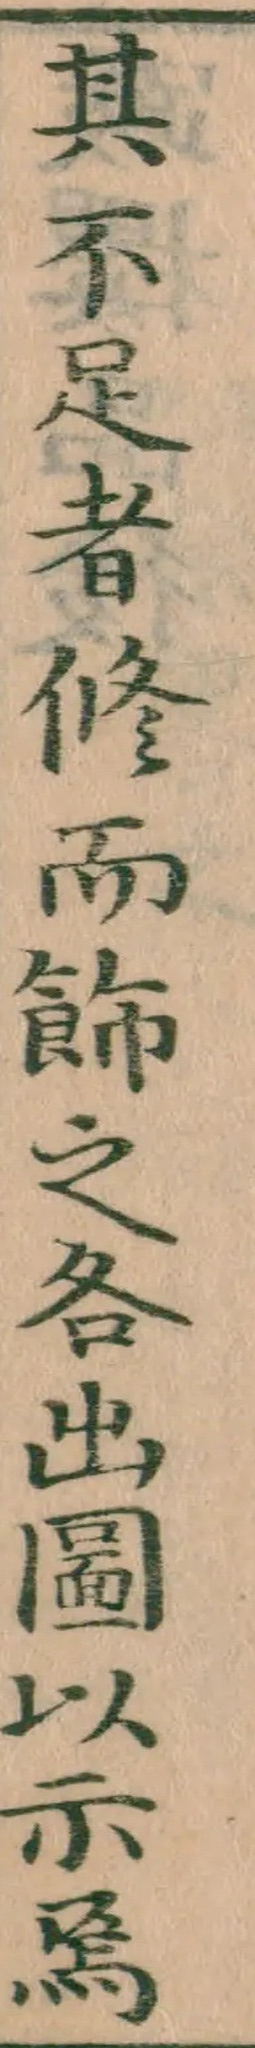其不足者修而飾之各出図以示焉
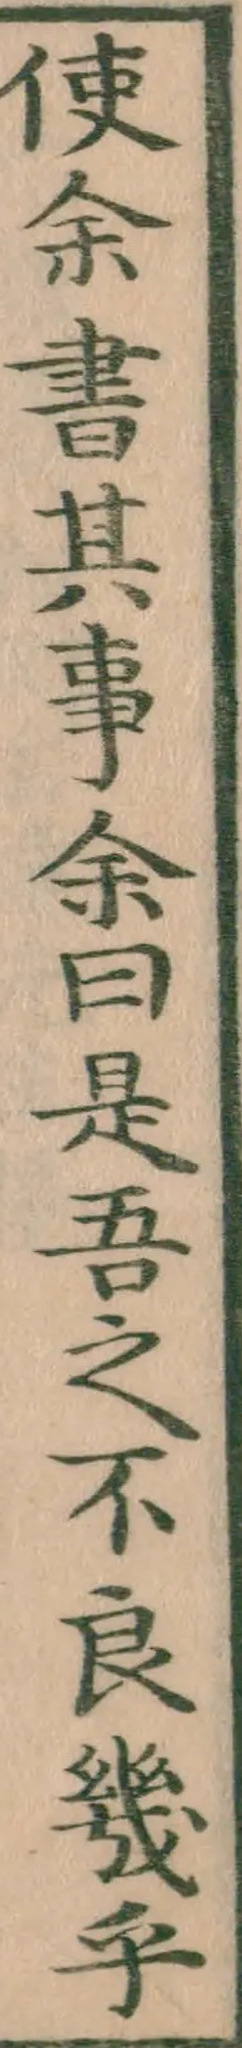使余書其事余曰是吾之不良幾乎
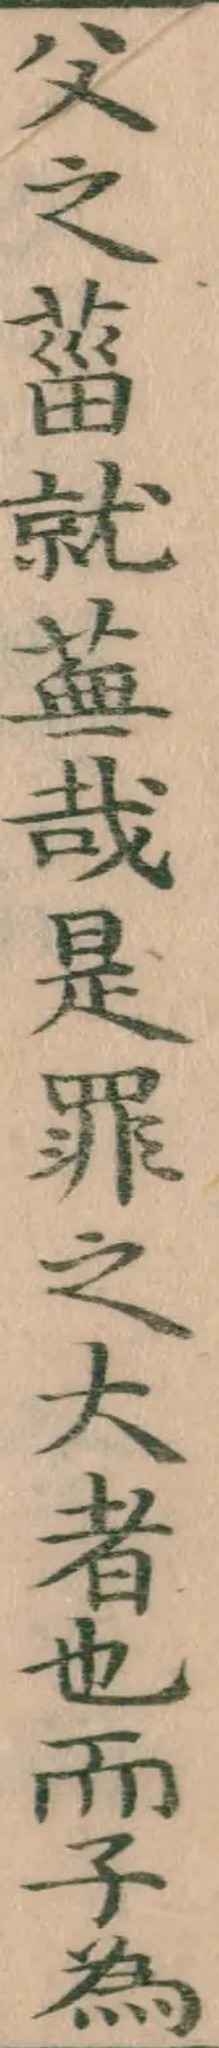父之菑就◼哉是罪之大者也而子為
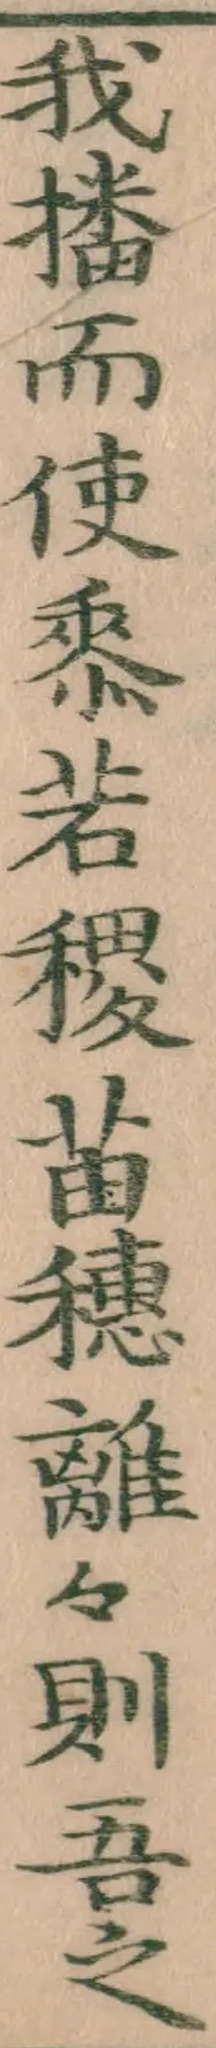我播而使若稷苗穂離々則吾之
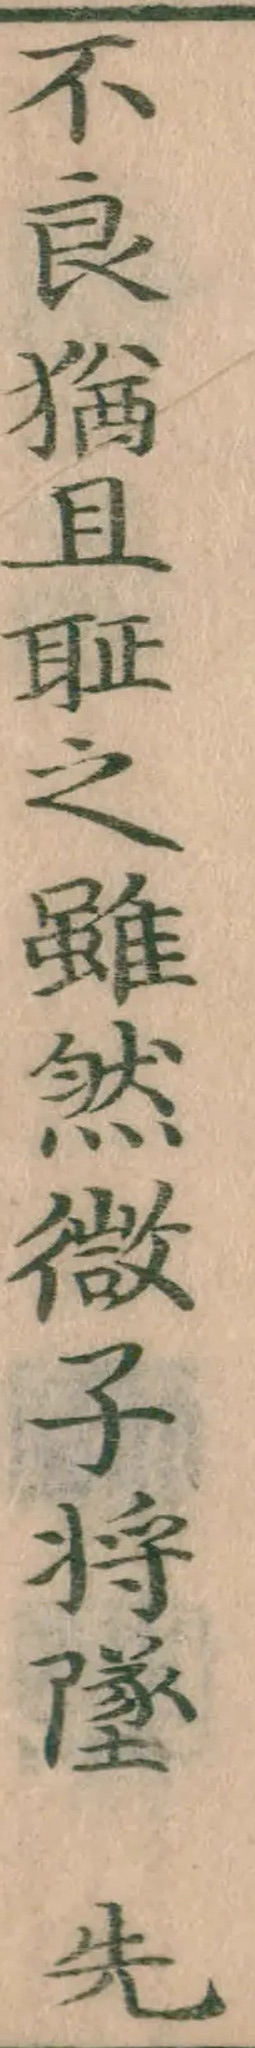不良猶且聇之雖然微子将墜先
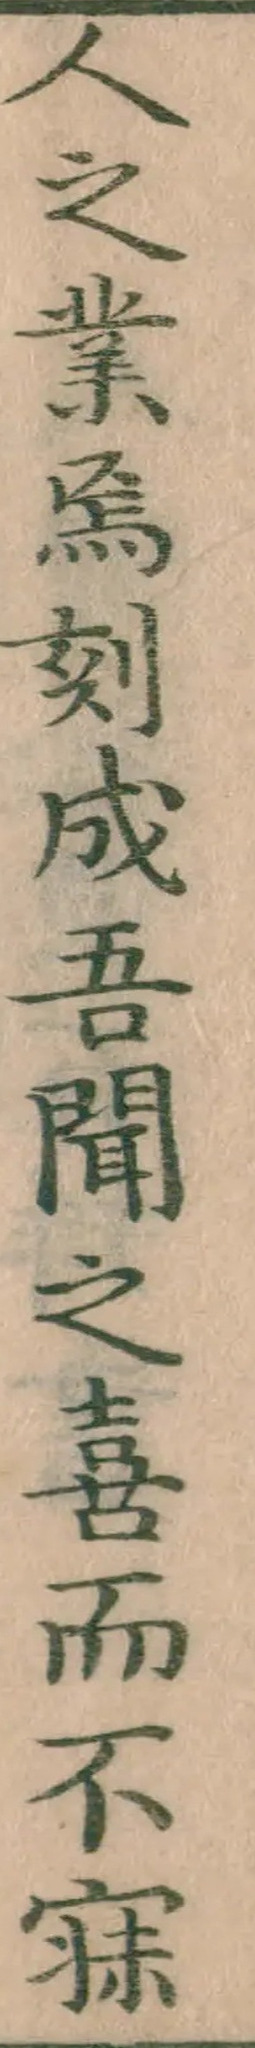人之業焉刻成吾聞之喜而不寐
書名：怡顔齋櫻品
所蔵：国立国会図書館 National Diet Library, JAPAN
